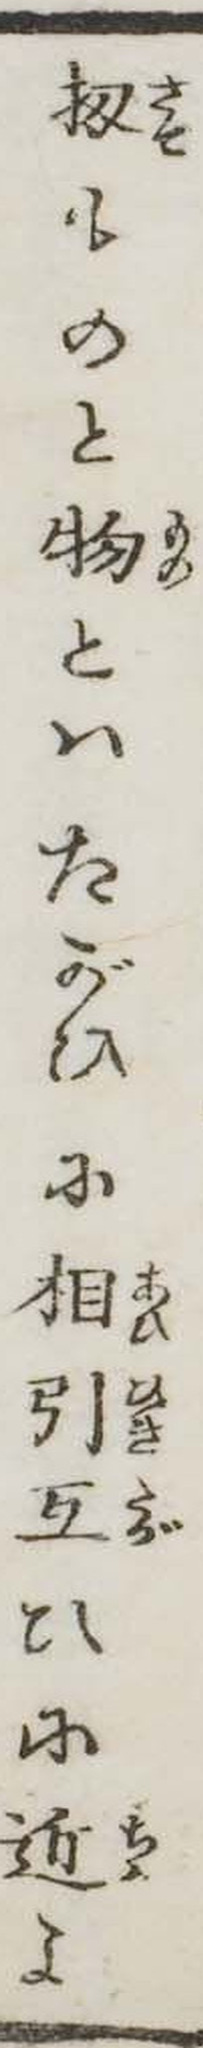扨ものと物とはたがひに相引互ひに近よ
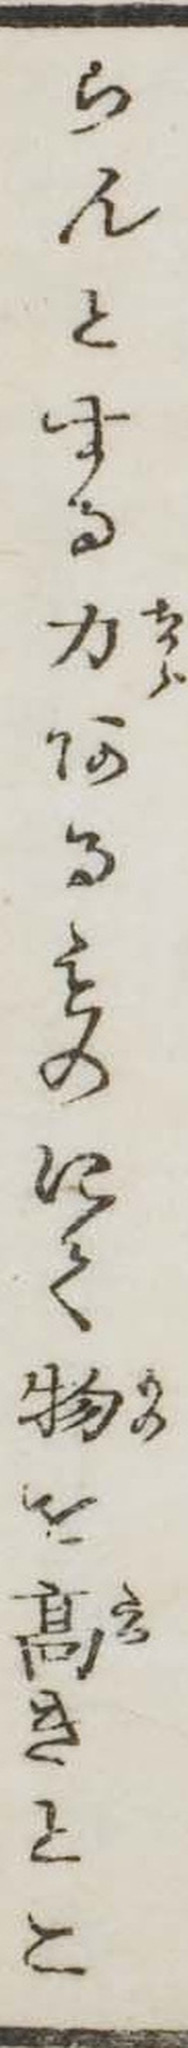らんとする力あるものにて物を高きとこ
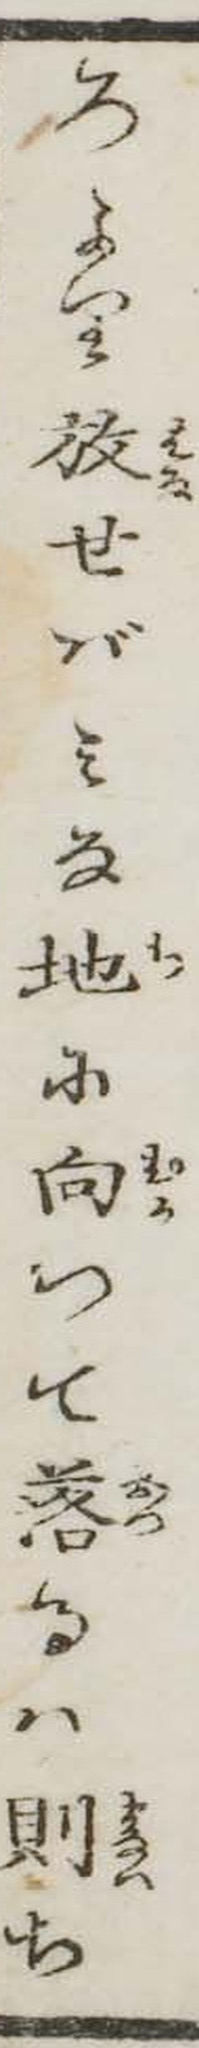ろより放せばみな地に向つて落るは則ち

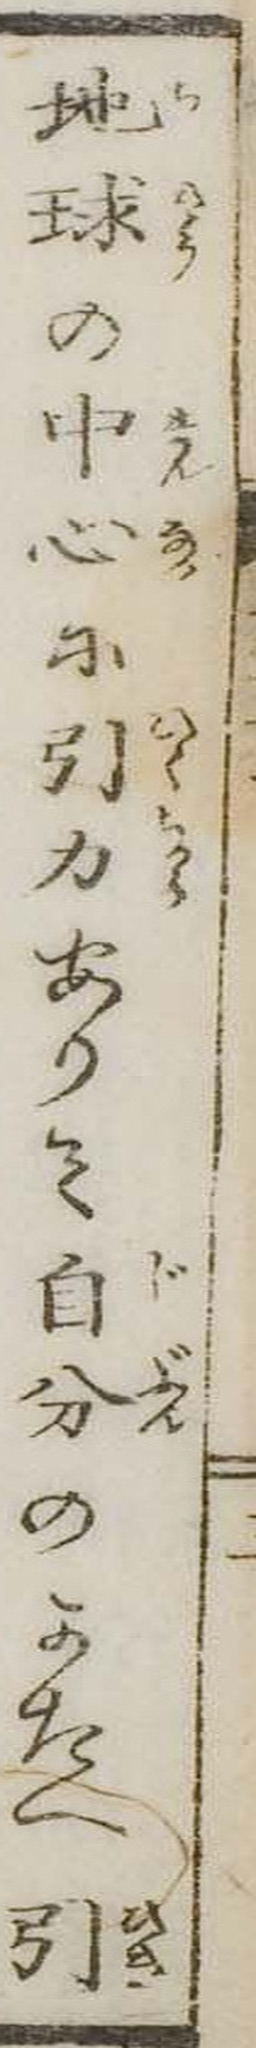地球の中心に引力ありて自分のかたへ引
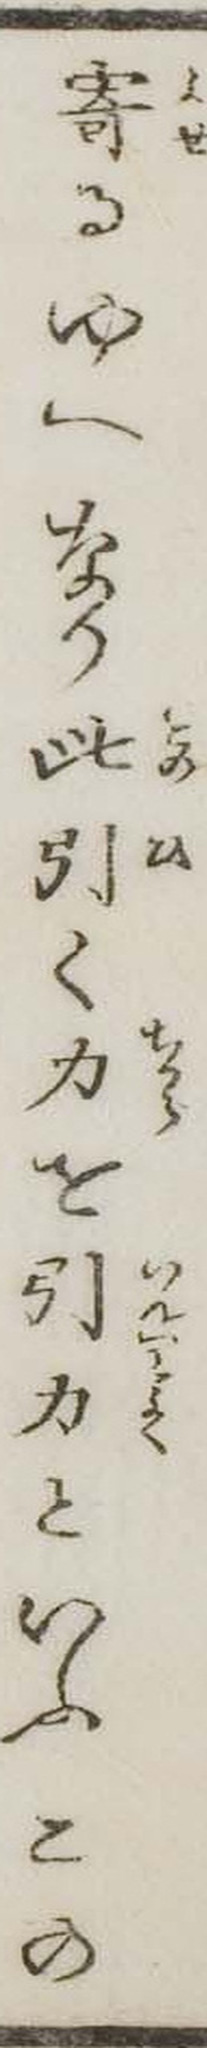寄るゆへなり此引く力を引力といふこの
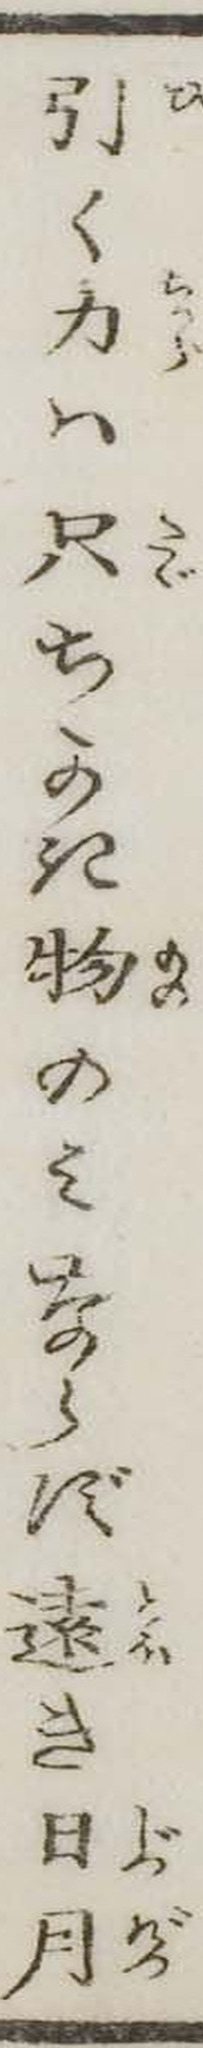引く力は只ちかき物のみならず遠き日月
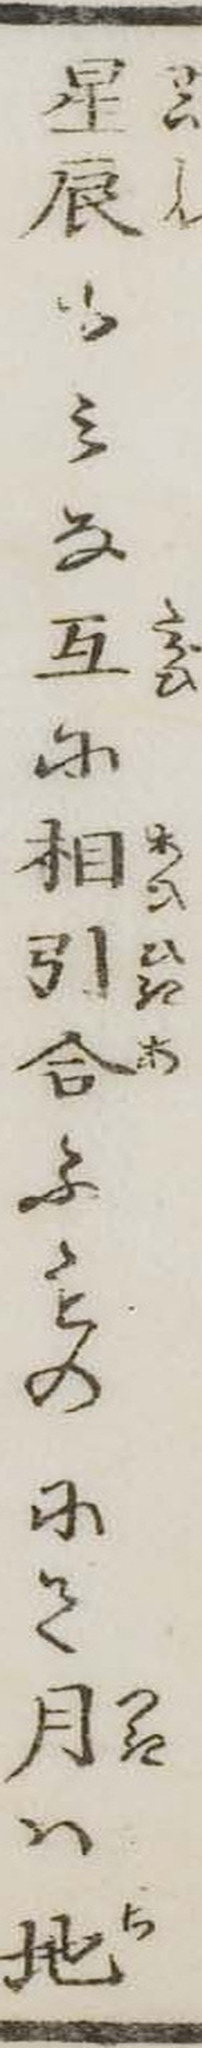星辰もみな互に相引合ふものにて月は地
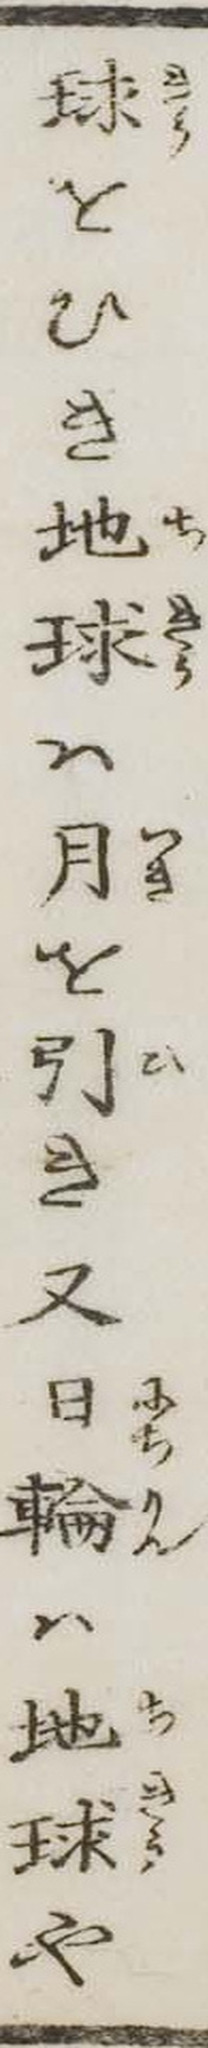球をひき地球は月を引き又日輪は地球や
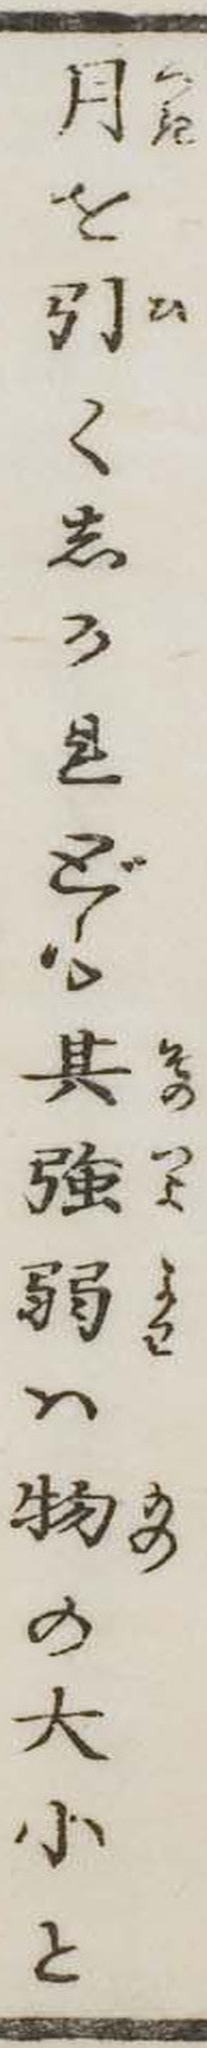月を引くしかれども其強弱は物の大小と
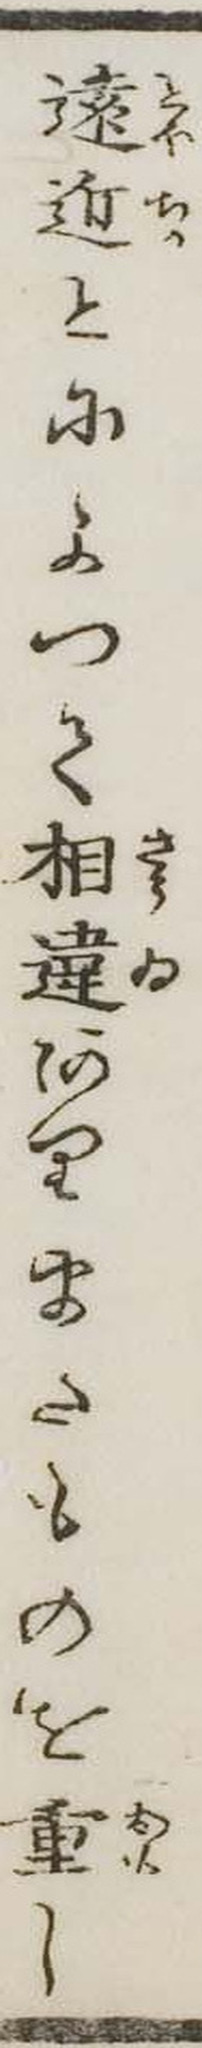遠近とによつて相違ありまたものを重し
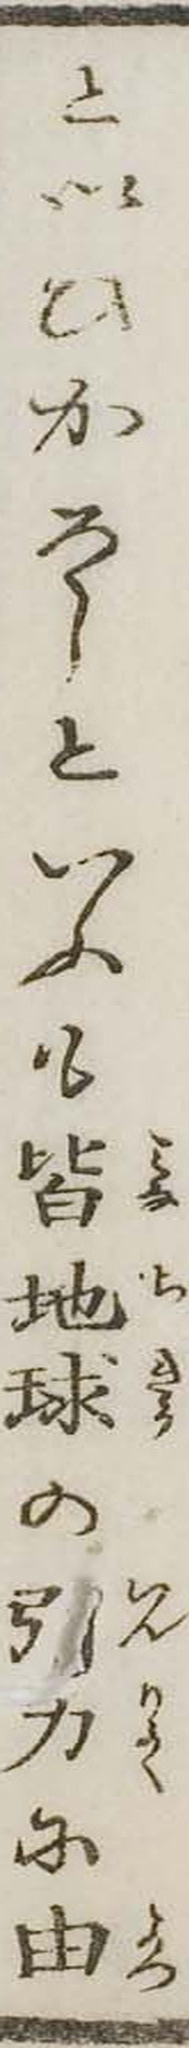といひかろしといふも皆地球の引力に由
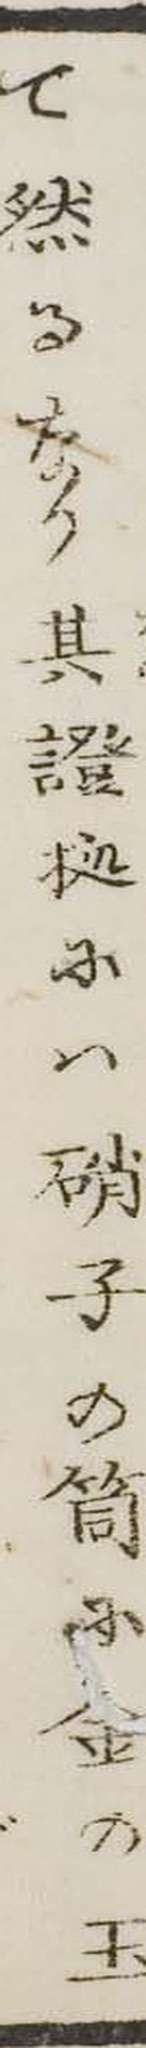て然るなり其證拠には硝子の筒に金の玉
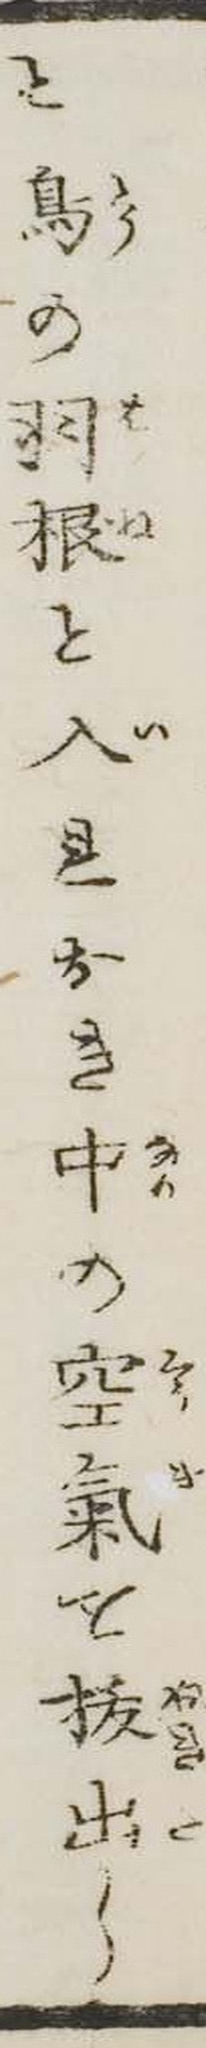と鳥の羽根と入れおき中の空氣を抜出し
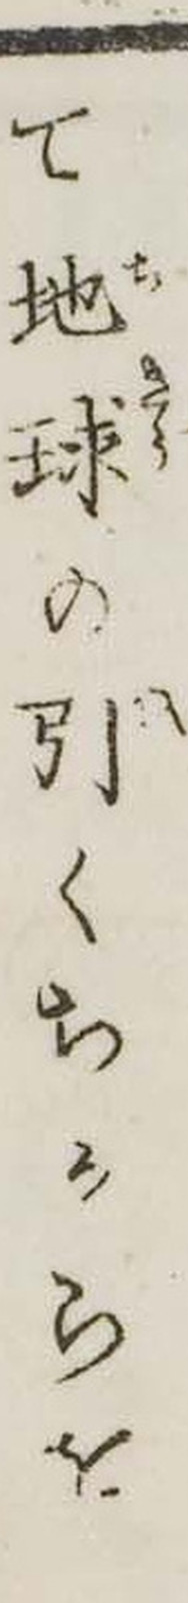て地球の引くちからを
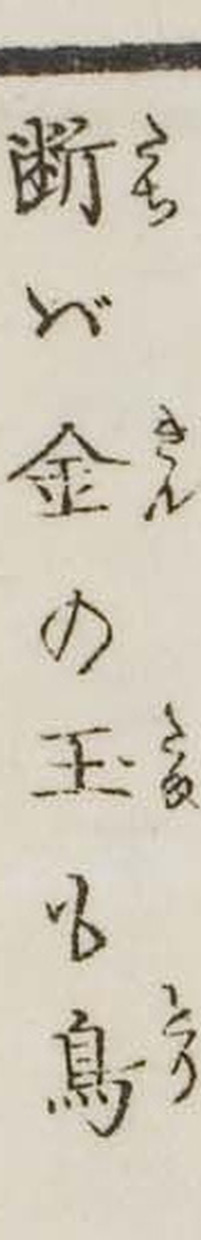断ば金の玉も鳥
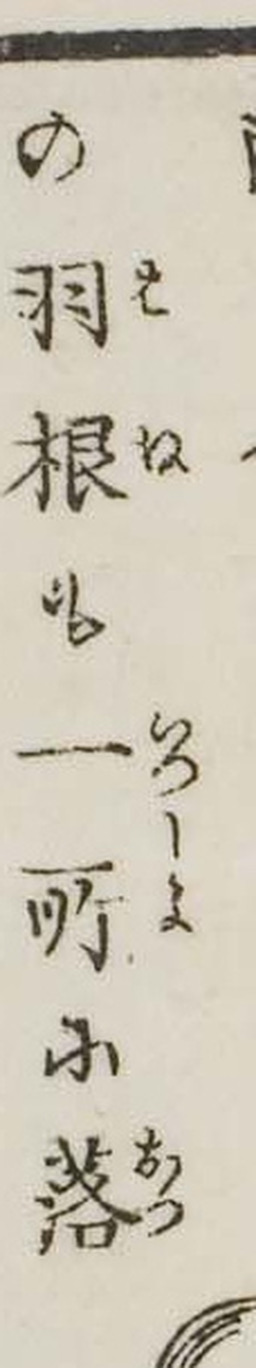の羽根も一所に落
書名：究理知慧の勧 : 訓蒙画入 巻之2
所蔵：東京学芸大学附属図書館
